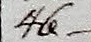46
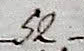52
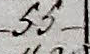55
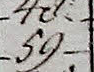59
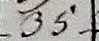35
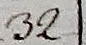32
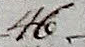46
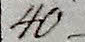40
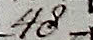48
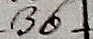36
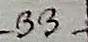33
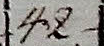42
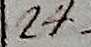24
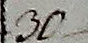30
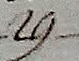29
